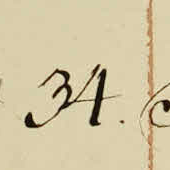34.
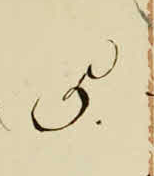5.
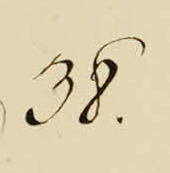38.
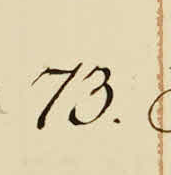73.
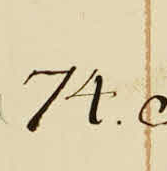74.
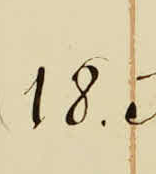18.
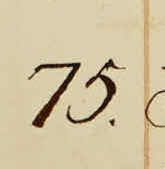75.
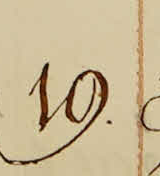19.
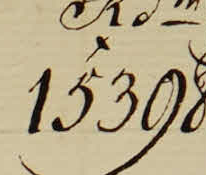15398
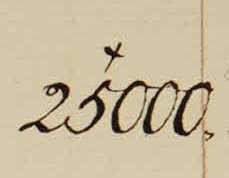25000
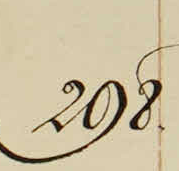298
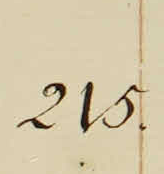215
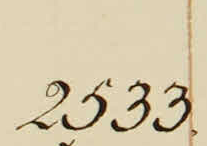2533
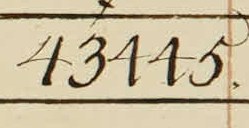43445
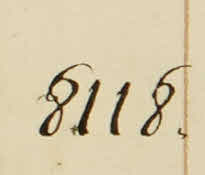8118
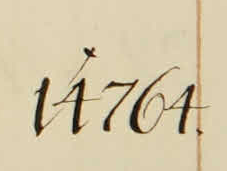14764
